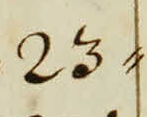23
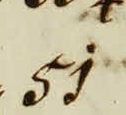51
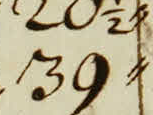39
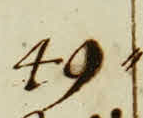49
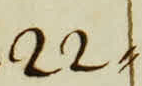22
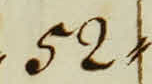52
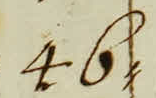46
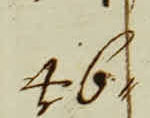46
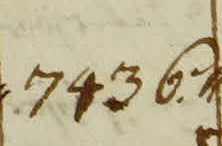7436.
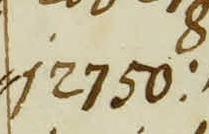12750
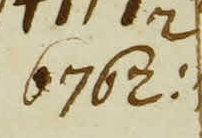6762
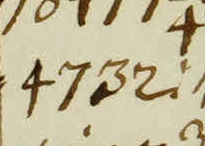4732.
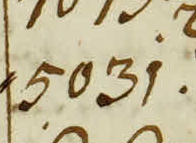5031
